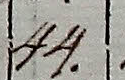44.
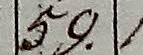59.
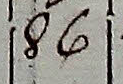86
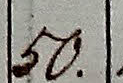50.
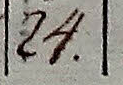24.
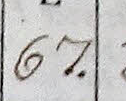67.
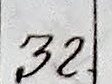32
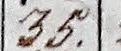35.
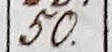50.
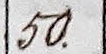50.
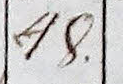48.
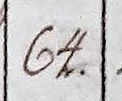64.
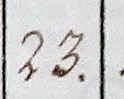23.
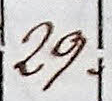29
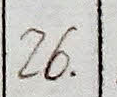26.
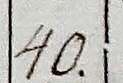40.
